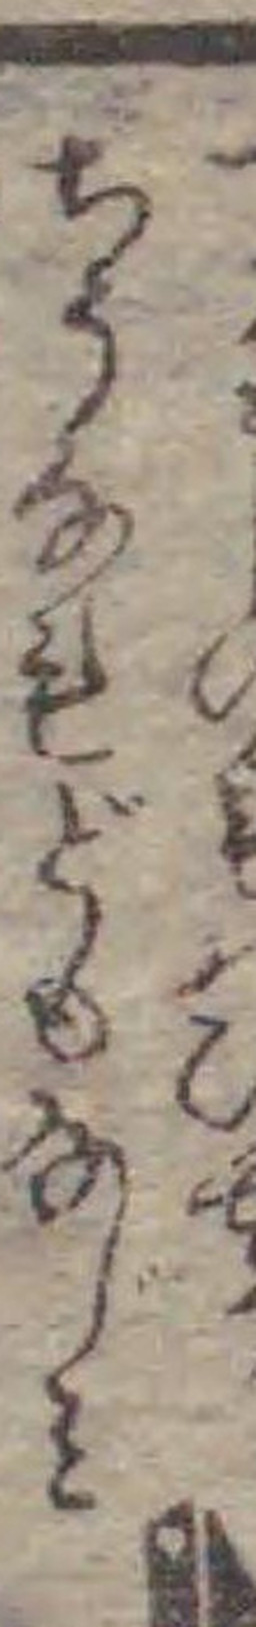ちうなれどもなしみ
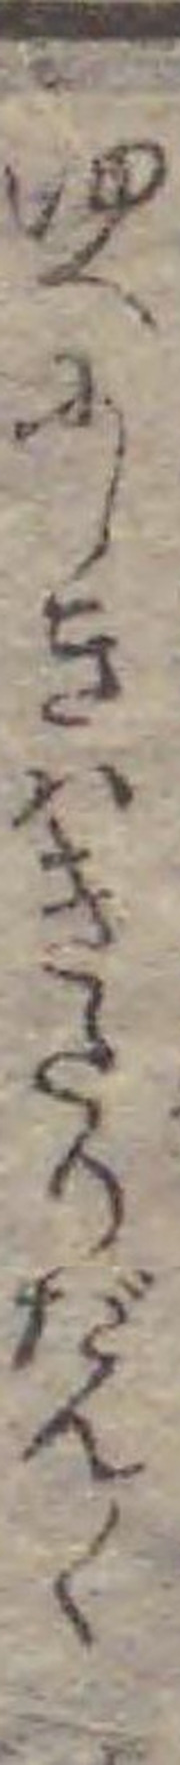ゆへにしきはきたりだん〳〵
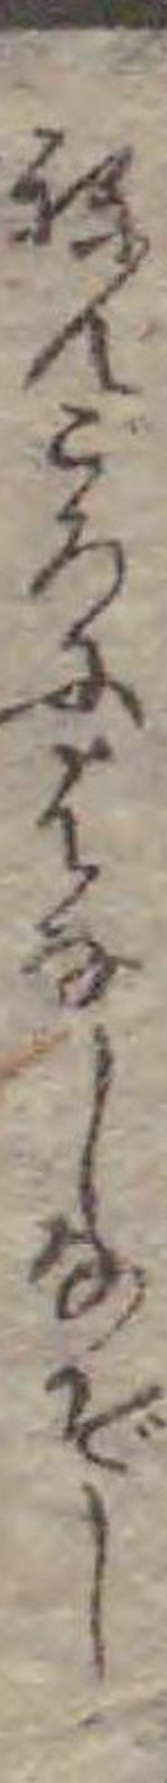ねんころにはなしなぞし
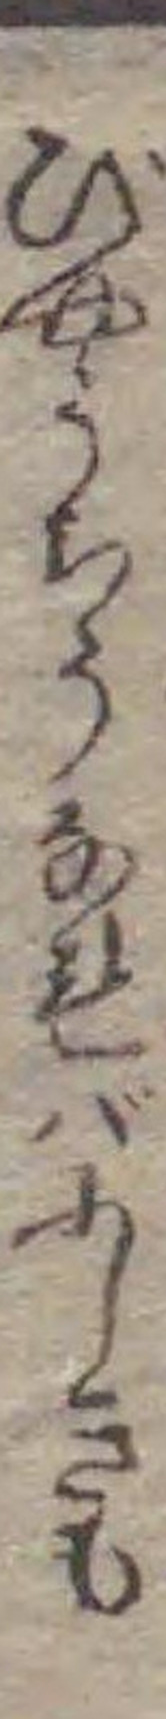びやうちうなればにしきも
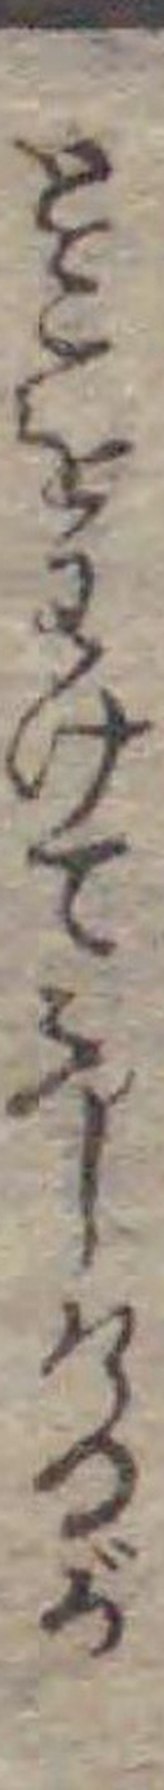とこをわけてふしけるが
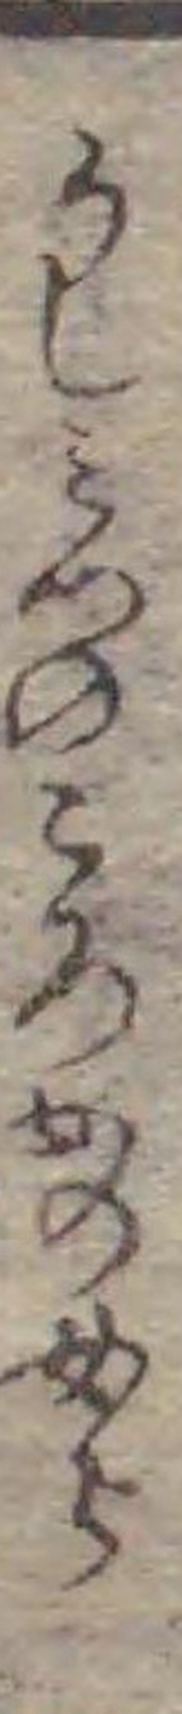うしみつのころかの女郎
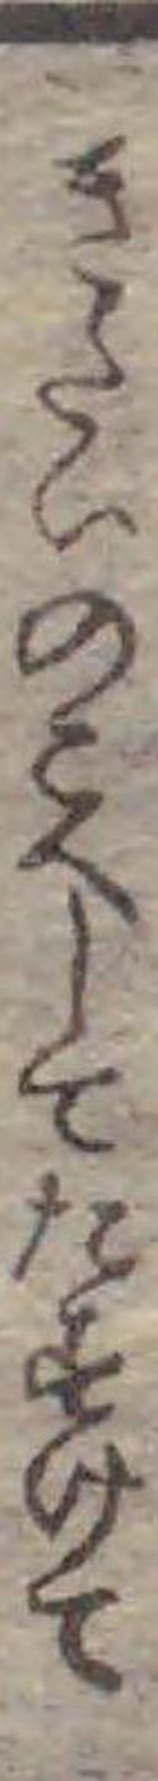きたいのこへしてたすけて
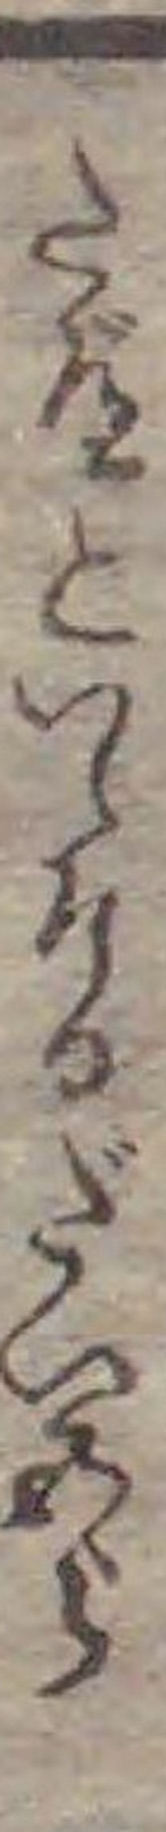たべといゝけるだい五郎
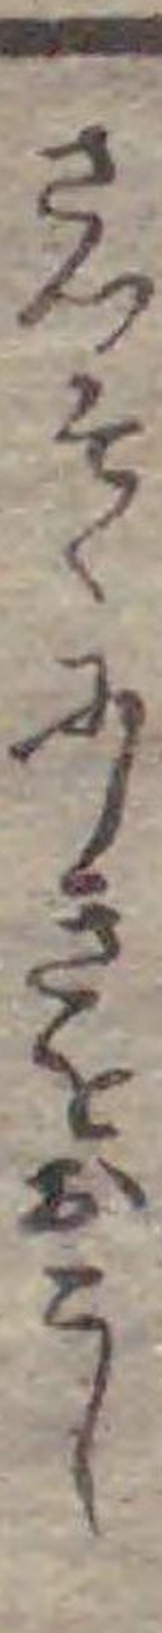さつそくにしきをおこし
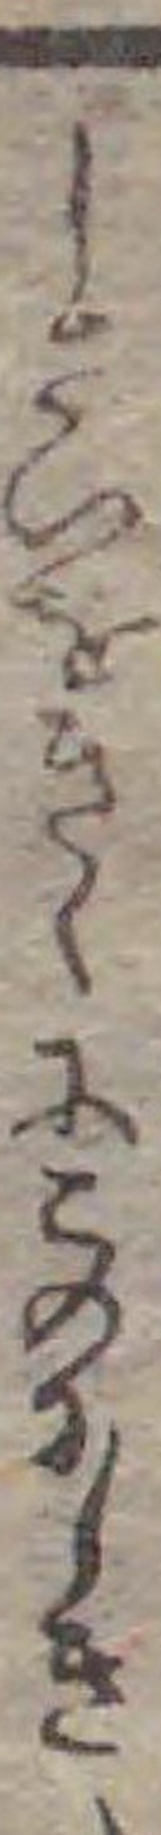しさいをきくにこのにしき
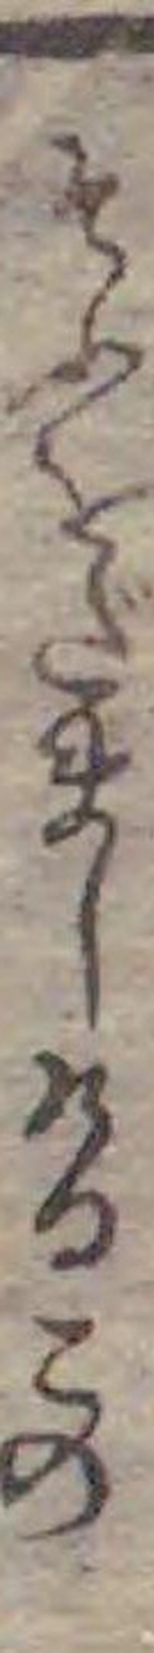そふをだましけるこの
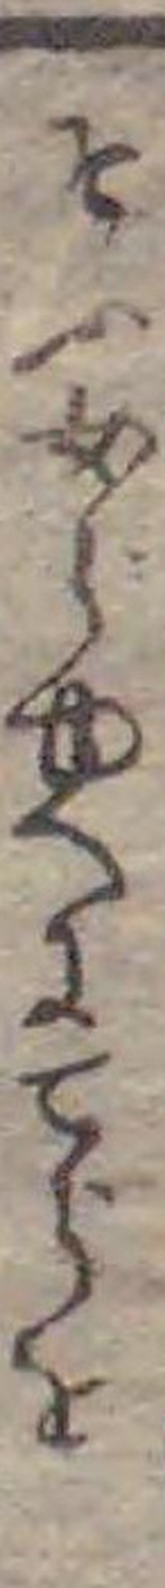そふ女郎ゆへにてらを
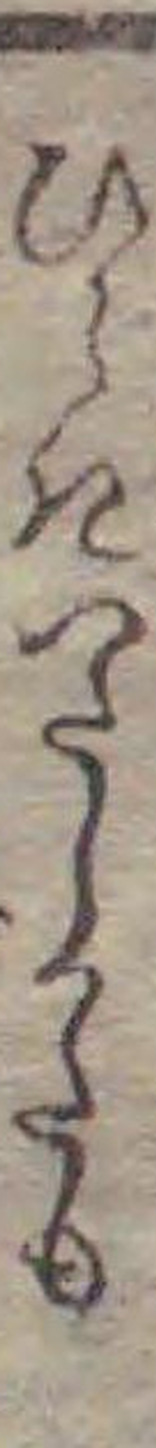ひらきいたしかたも
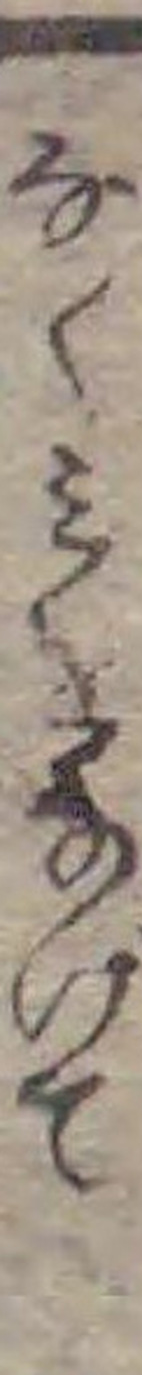なくみをなげて
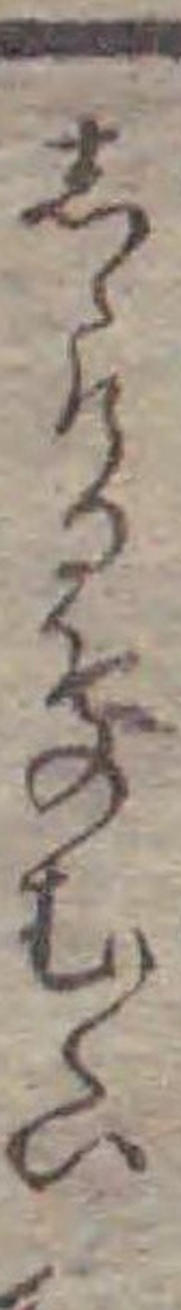しゝけるそのむくい
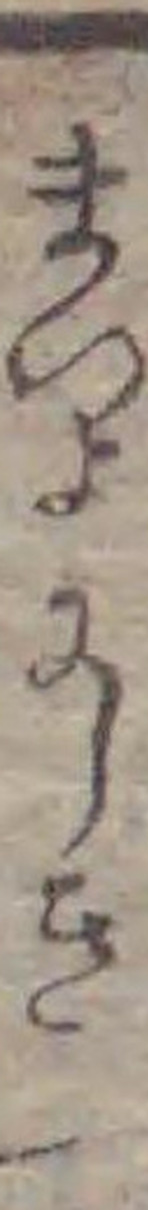まいよにしき
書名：変化物春遊 : 2巻
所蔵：国立国会図書館 National Diet Library, JAPAN
